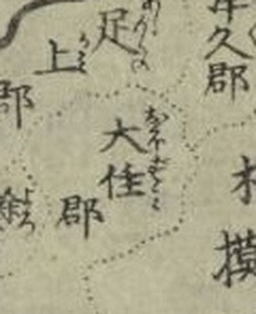大住郡
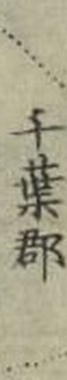千葉郡

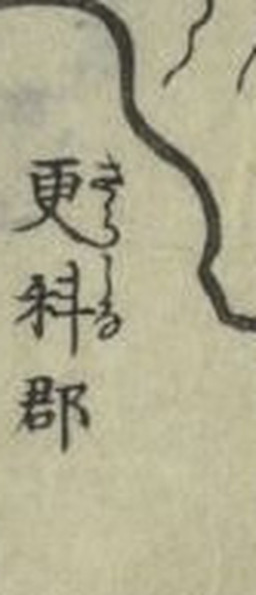更科郡
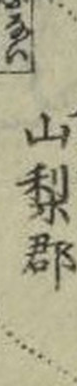山梨郡
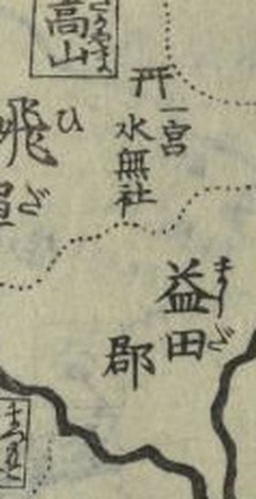水無社
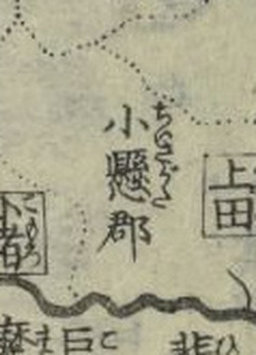小懸郡
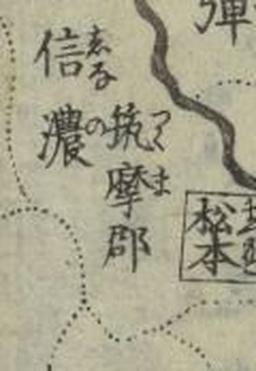筑摩郡
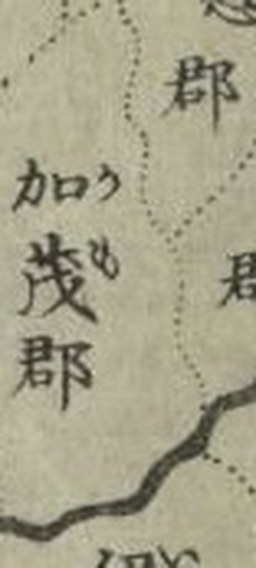加茂郡
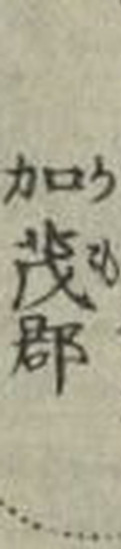加茂郡
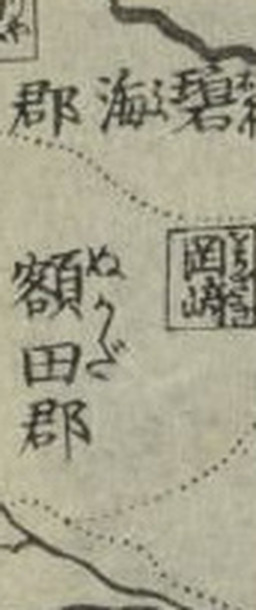額田郡
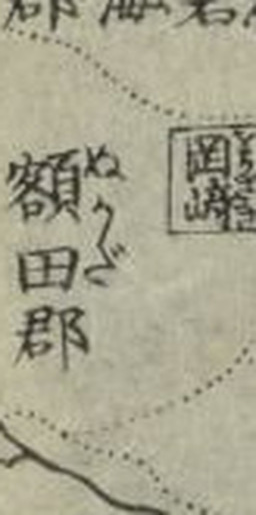額田郡
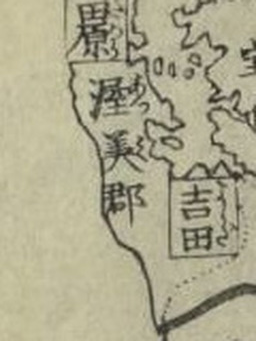渥美郡

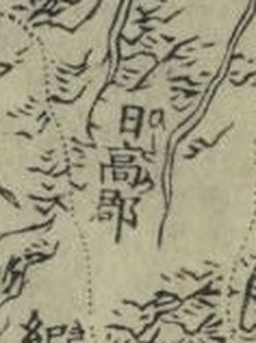日高郡

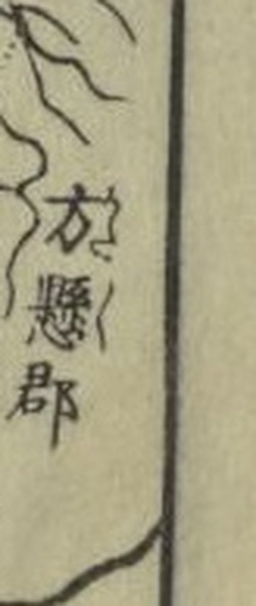山懸郡
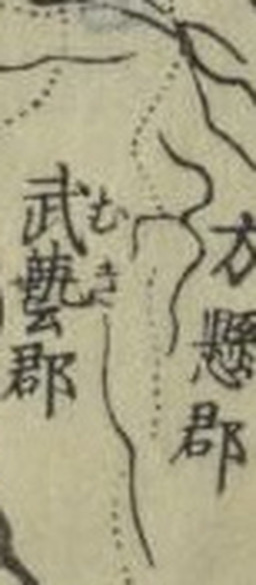武藝郡
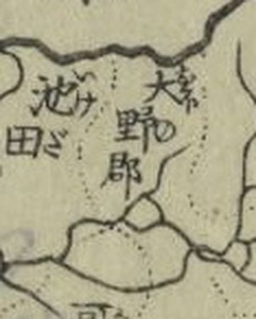大野郡
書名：大日本分境図成
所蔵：University of the Ryukyus Library
